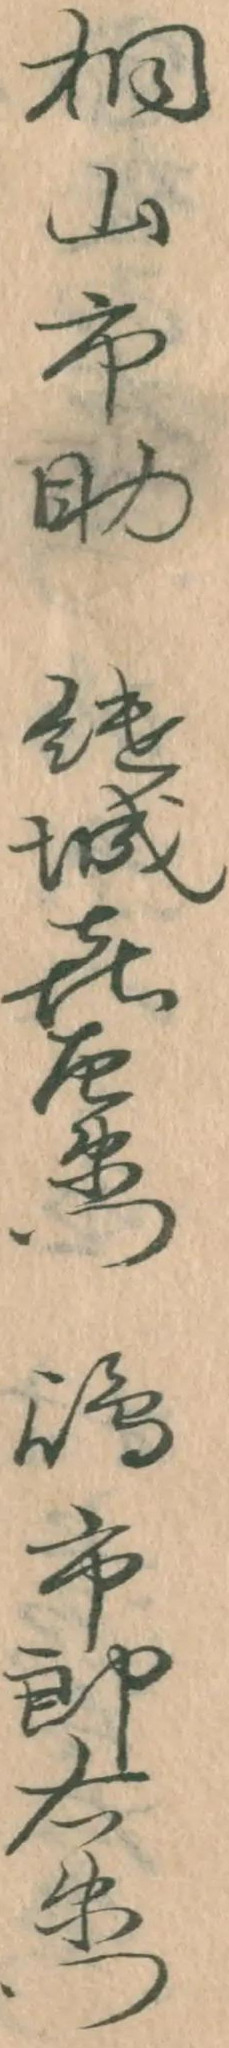桐山市助継城喜左衛門島市郎右衛門
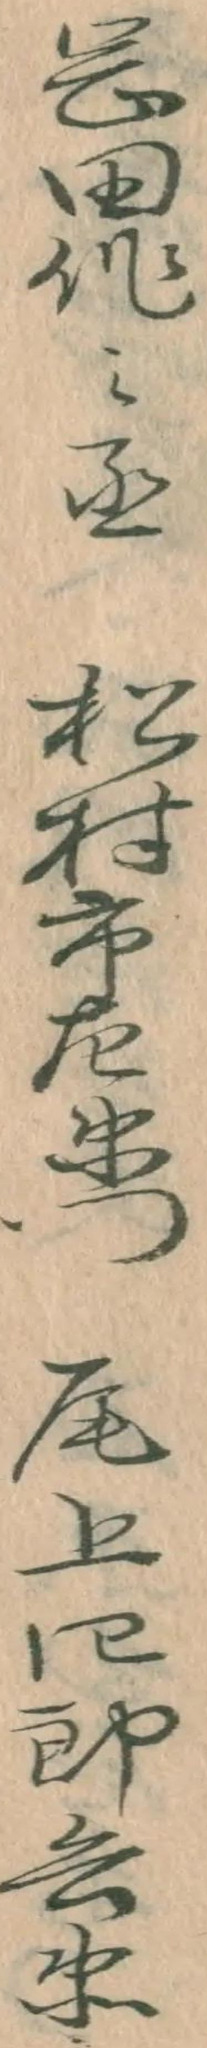岡田作之丞松村市左衛門尾上四郎兵衛
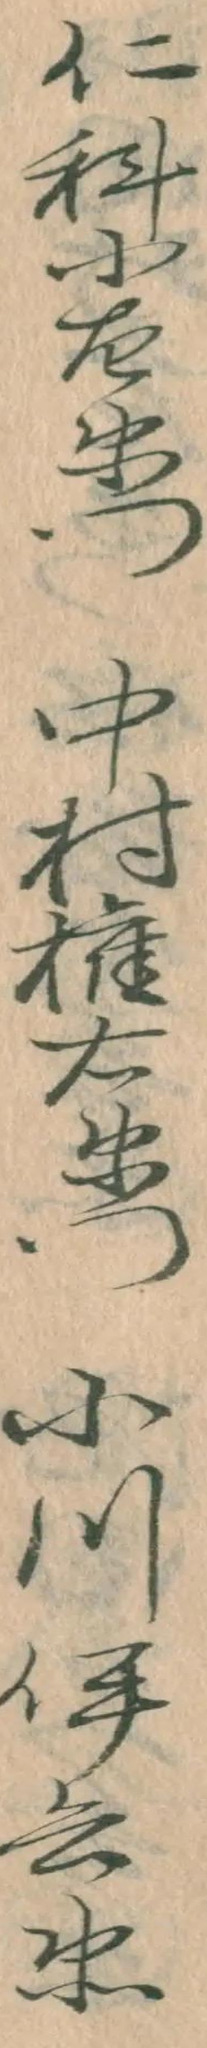仁科小左衛門中村権右衛門小川伊兵衛
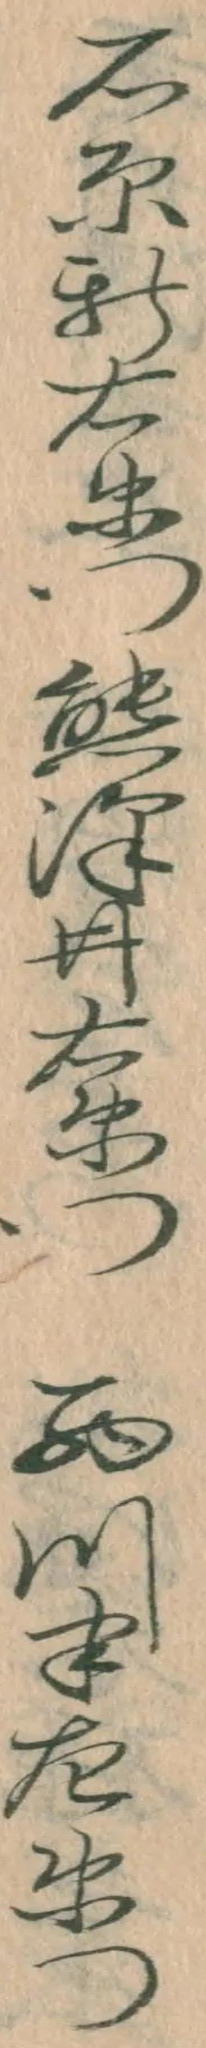石原新右衛門熊沢井右衛門西川半左衛門
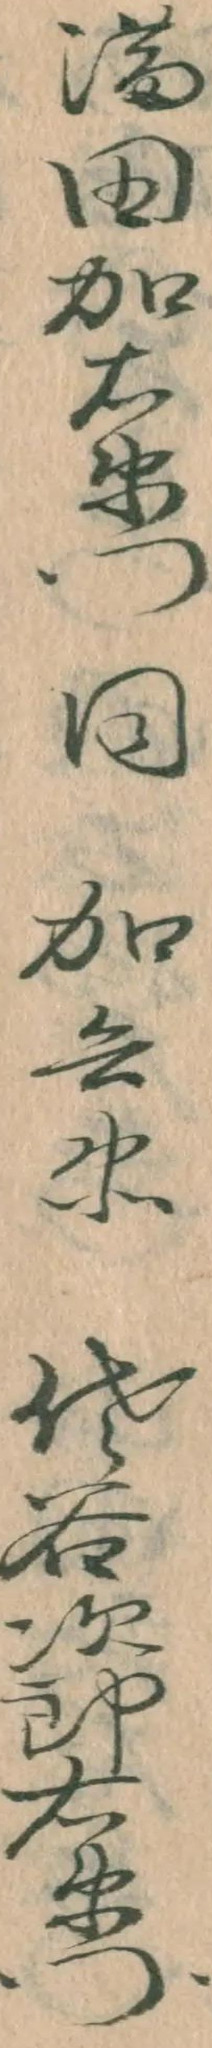満田加右衛門同加兵衛佐谷次郎右衛門
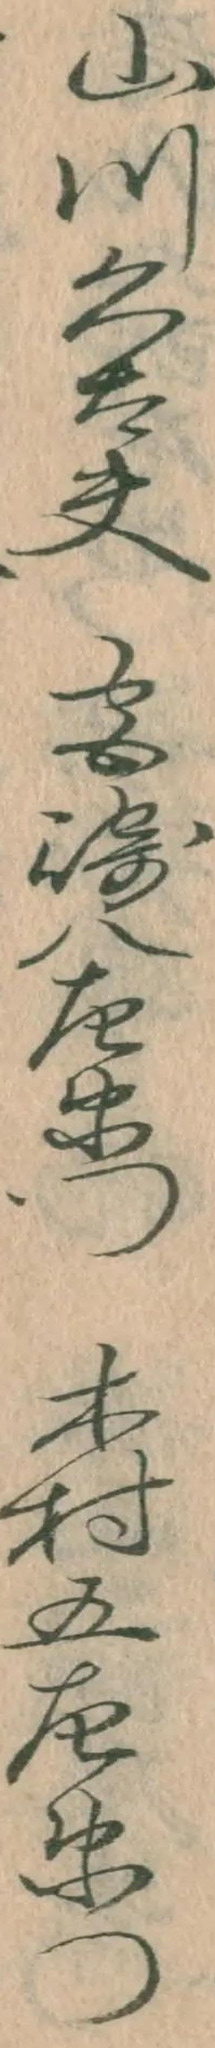山川久太夫宮崎八左衛門木村五左衛門
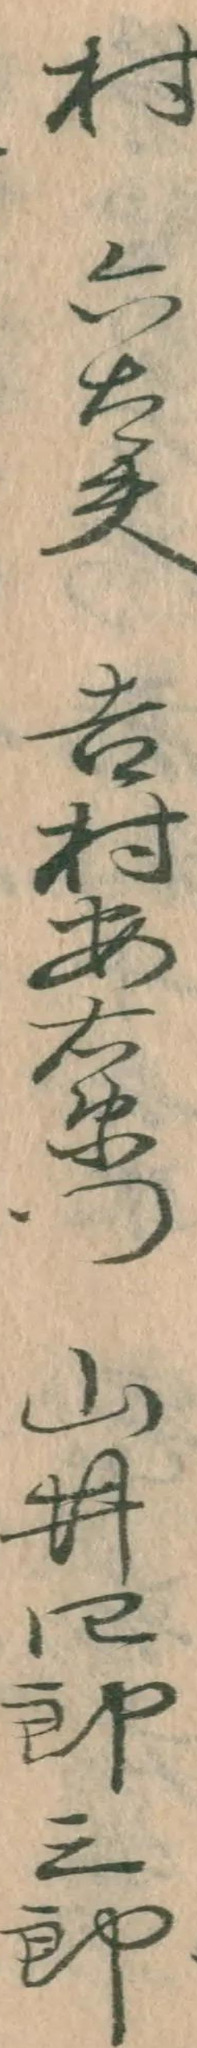村六太夫吉村安右衛門山井四郎三郎
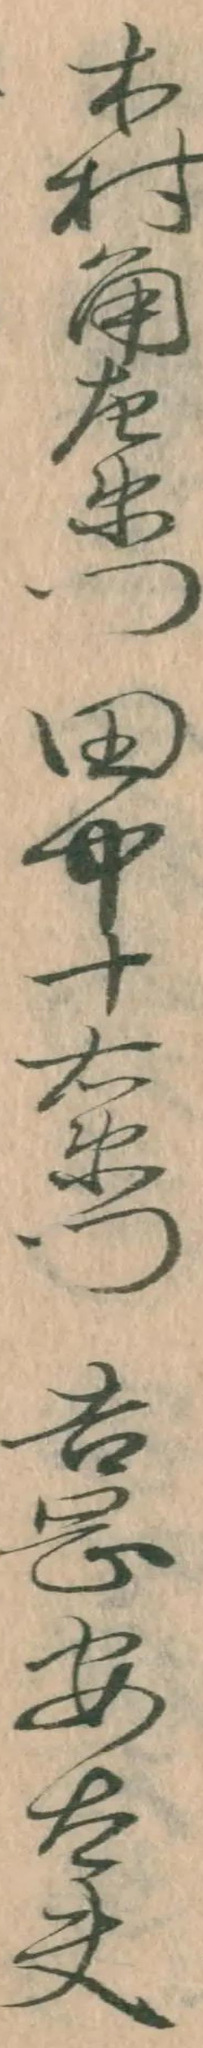木村角左衛門田中十右衛門吉岡安太夫
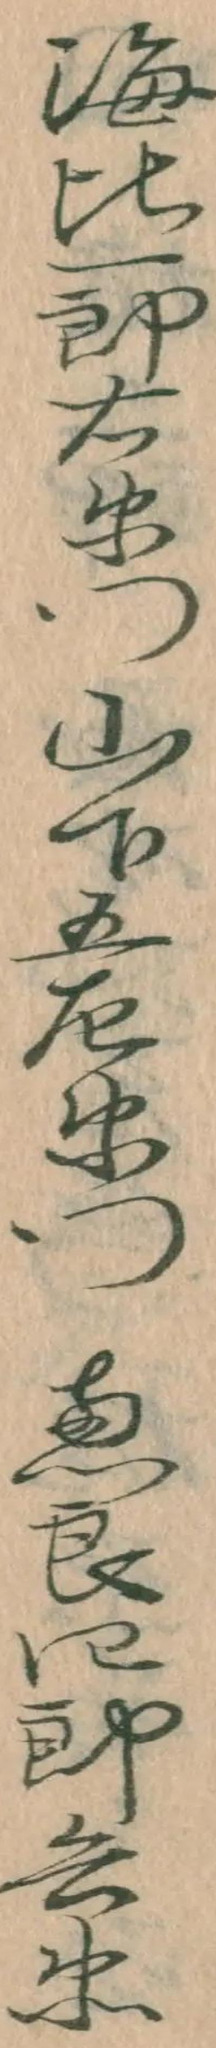海比又右衛門山下五左衛門恵良四郎兵衛
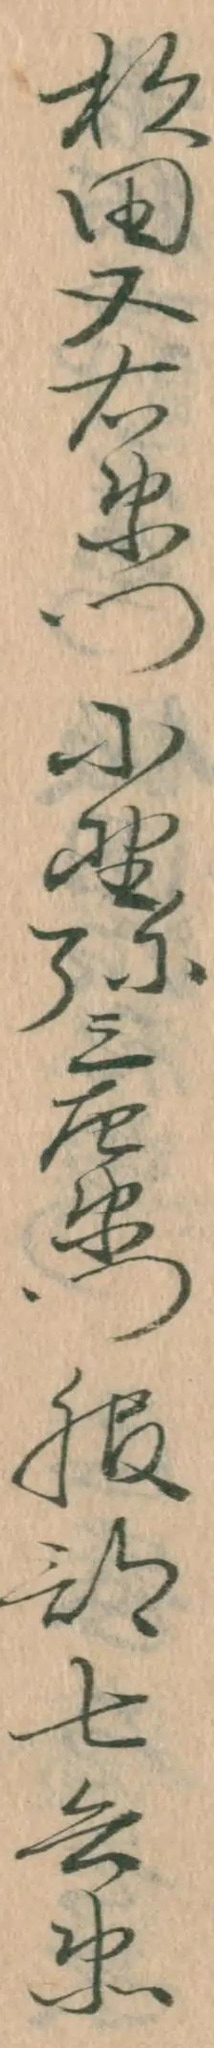杉田又右衛門小野弥三左衛門服部七兵衛
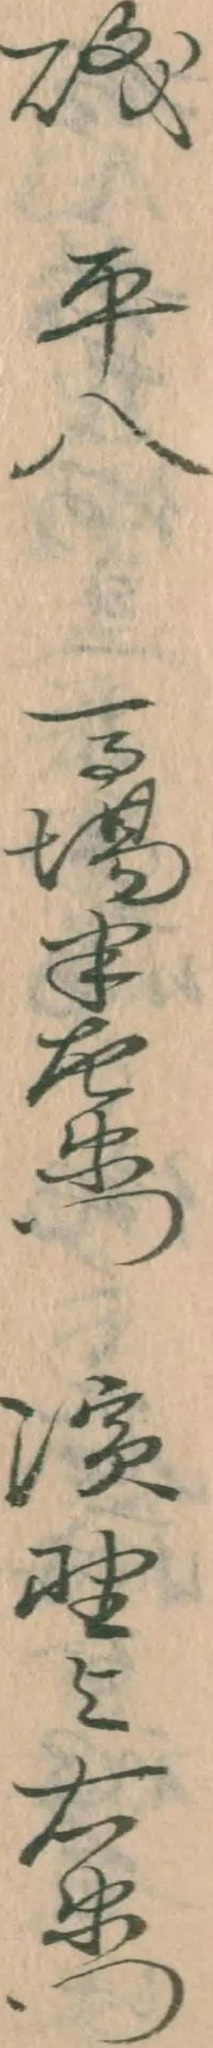磯平八馬場半左衛門浜野与右衛門
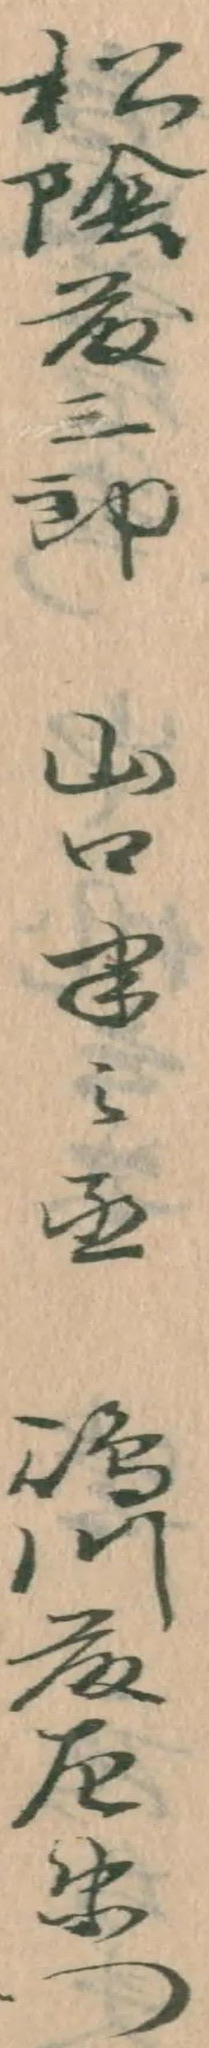松陰藤三郎山口半之丞島川藤左衛門
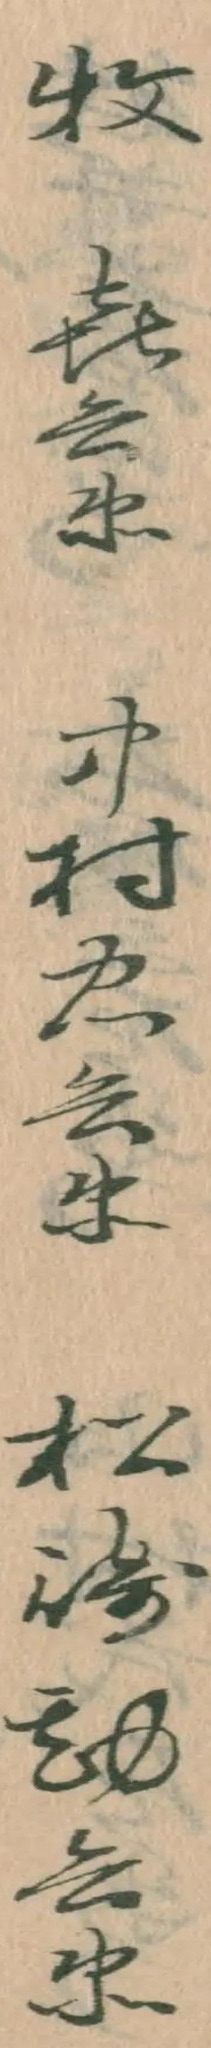牧喜兵衛中村忠兵衛松崎勘兵衛
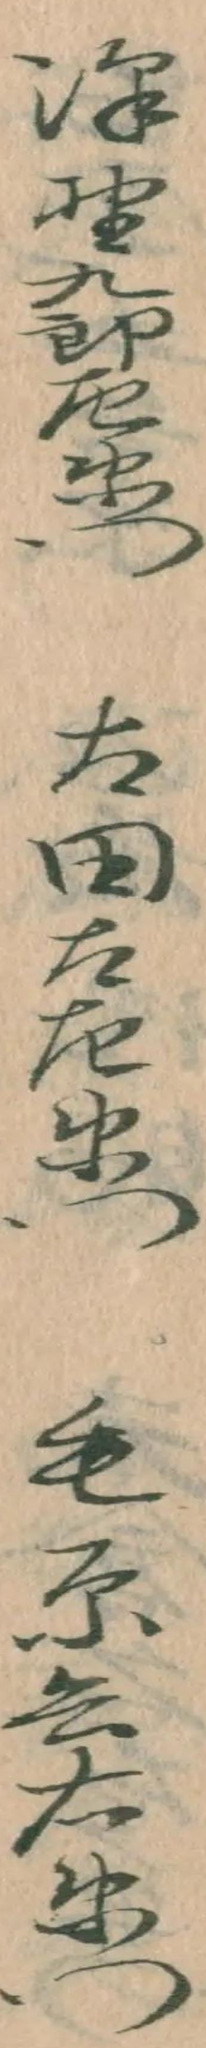沢野九郎左衛門太田太左衛門毛原兵右衛門
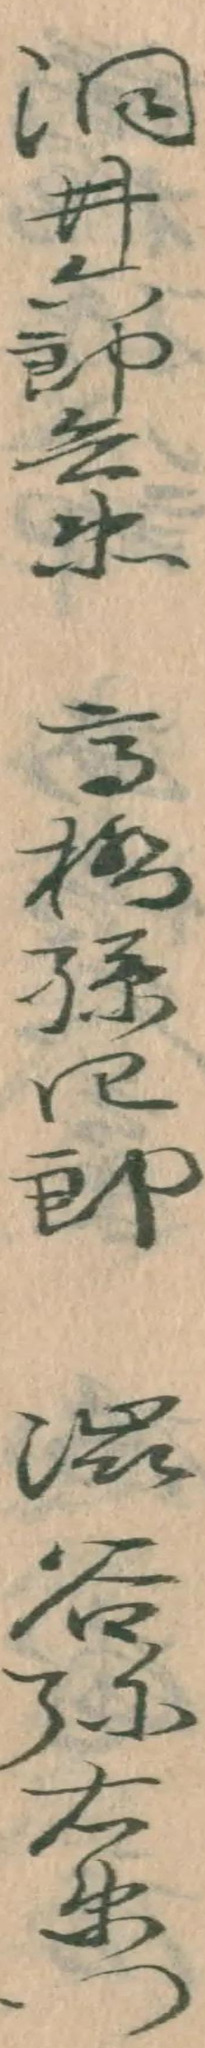洞井六郎兵衛高橋孫四郎渋谷弥右衛門
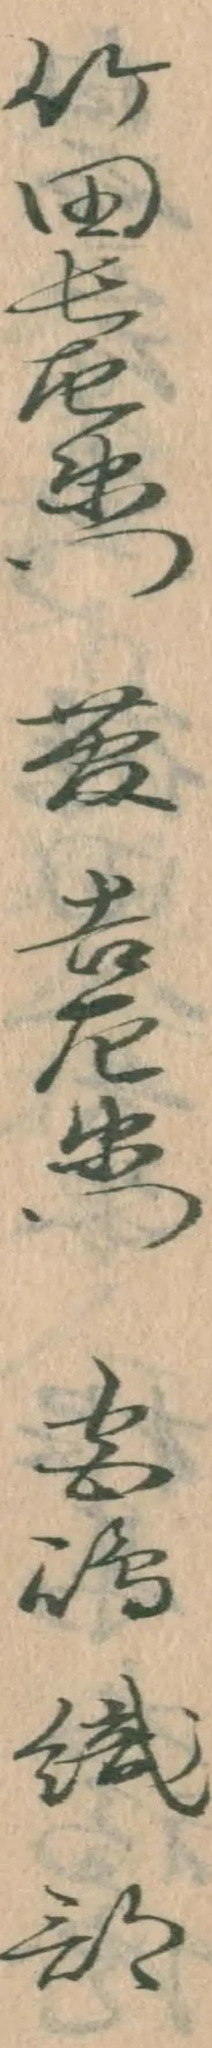竹田長左衛門菅吉左衛門宮島織部
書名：切支丹御退治記 49巻. [9]
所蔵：国立国会図書館 National Diet Library, JAPAN
